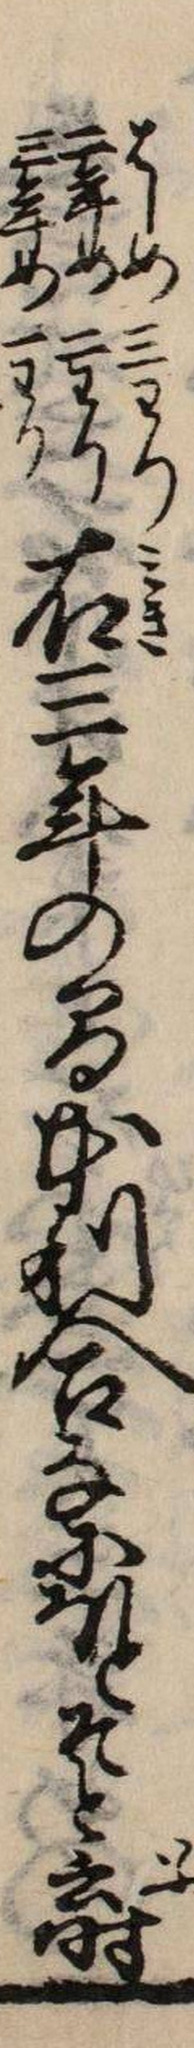一年の間右三年の間本利合なにほと云時
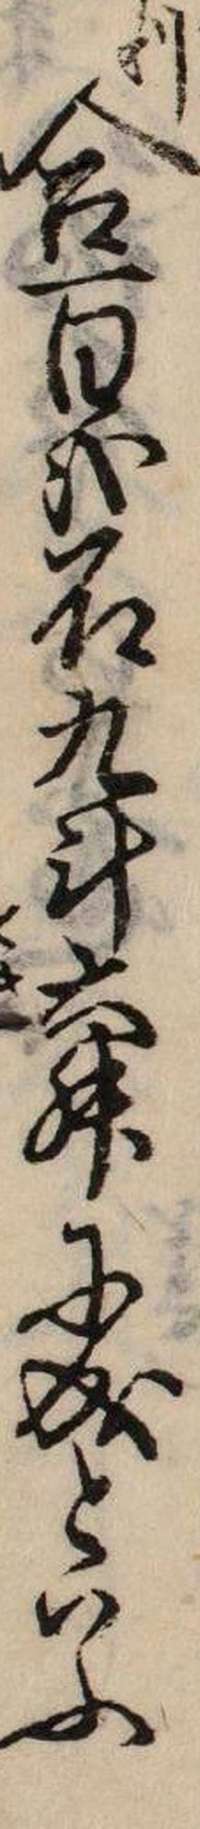合一日弐石九斗六升に成といふ
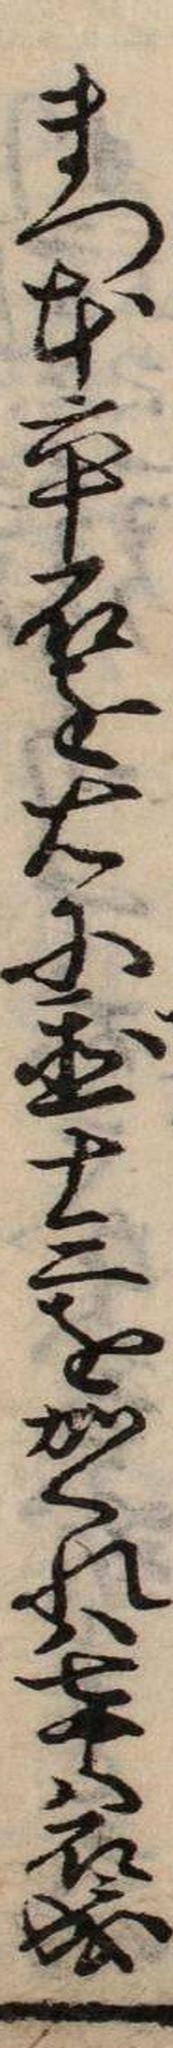まつ本草石を右に置十三をかくれは七十は石成
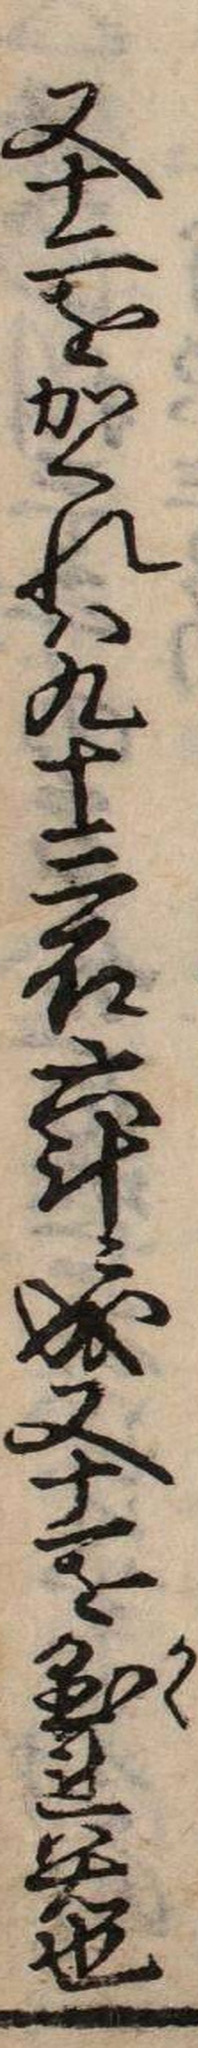又十二をかくれは九十三石六斗に成又十一を懸れ着也

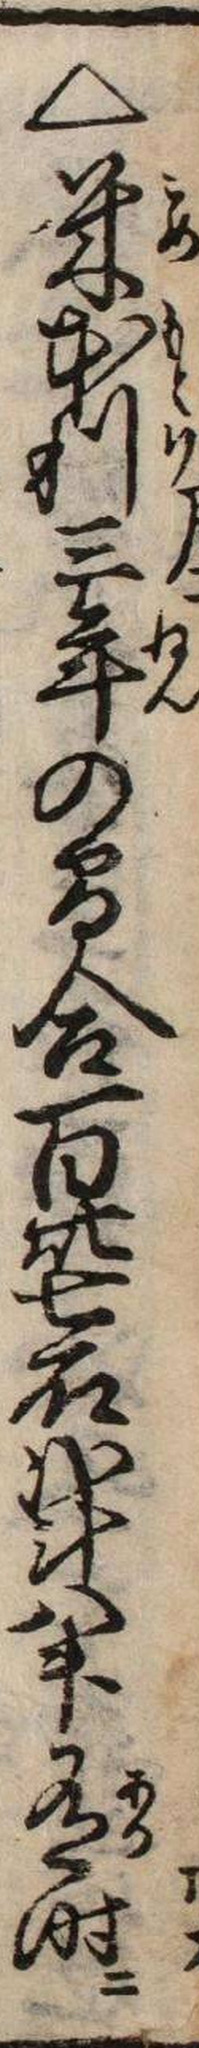△米(こめ)本利三年の間合百卅七石弐斗八升有時に
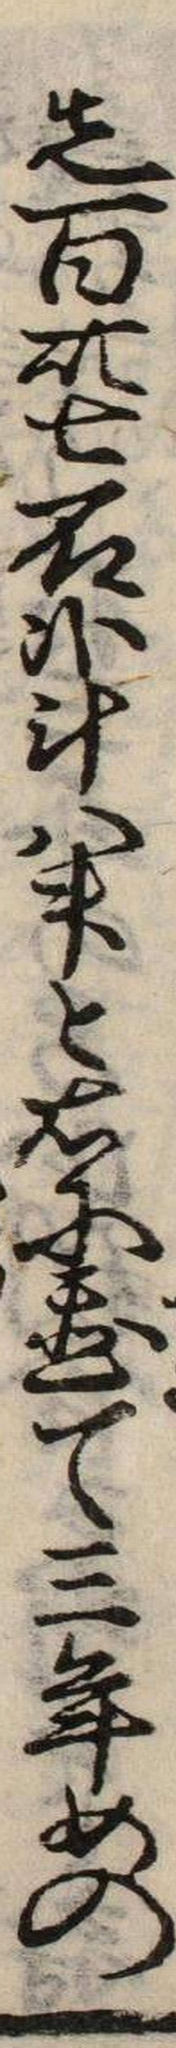先百卅七石弐斗八升と右に置て三年めの
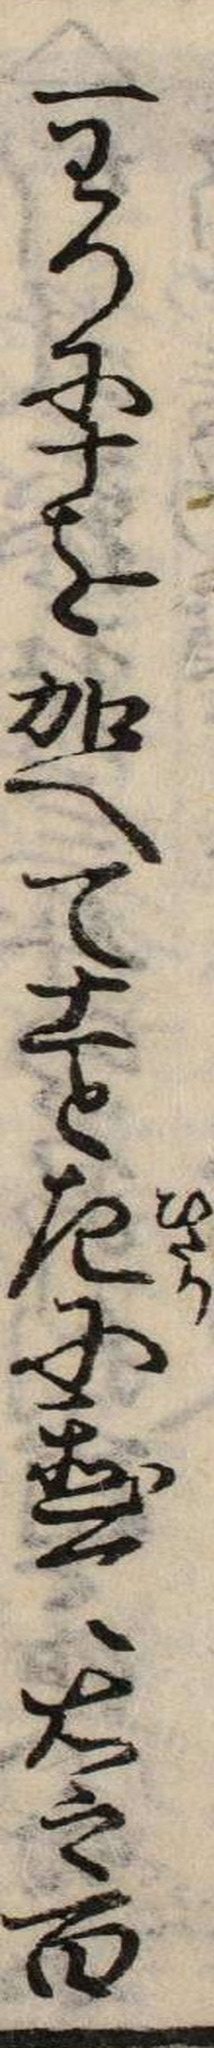一わりに十を加へて十一と左に置て右の百
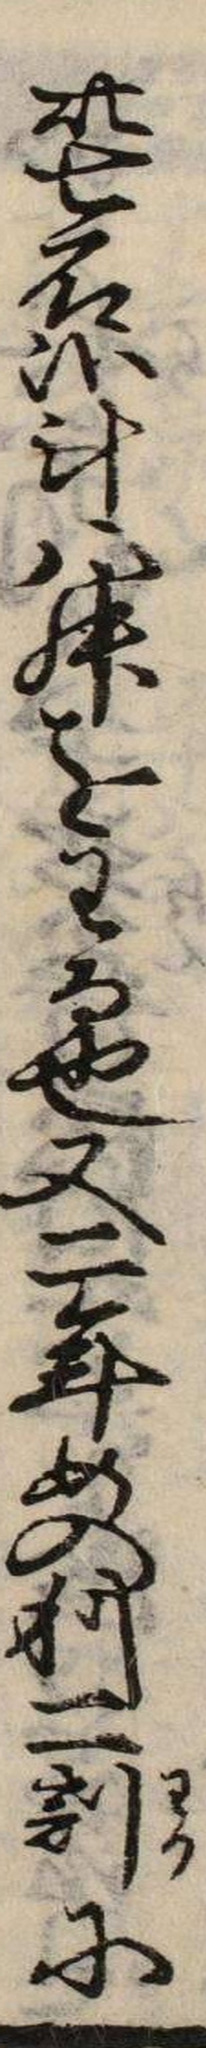丗七石弐斗八舛をわる也又二年めの利二刻に
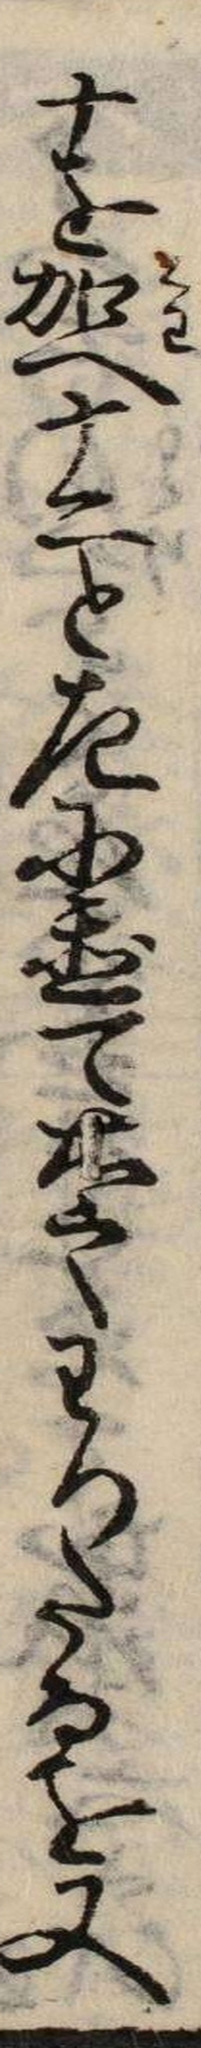十を加へ十二と左に置て右のわりたるを又
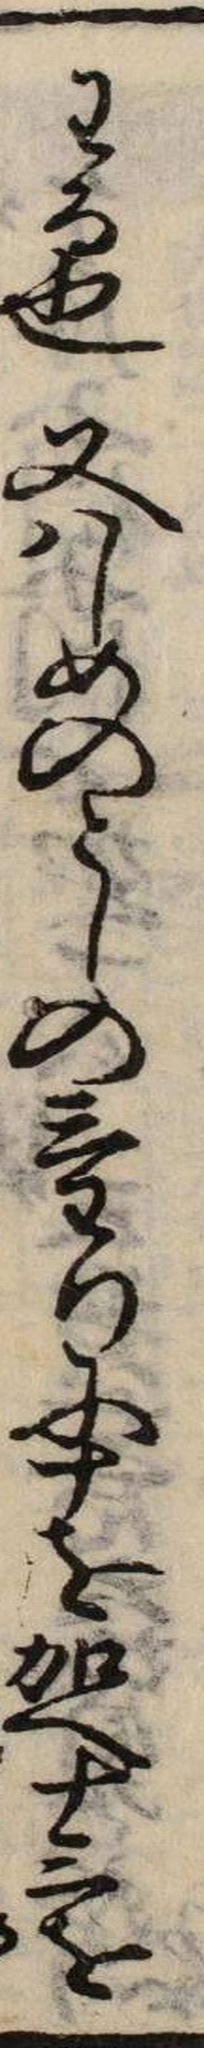わる也又はしめのとしの三わりに十を加へ十三を
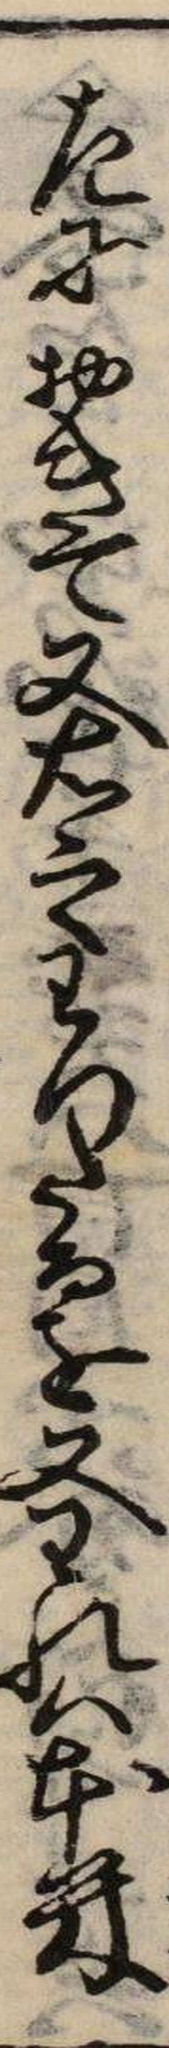左におきて又右のわりたるを又われは本米
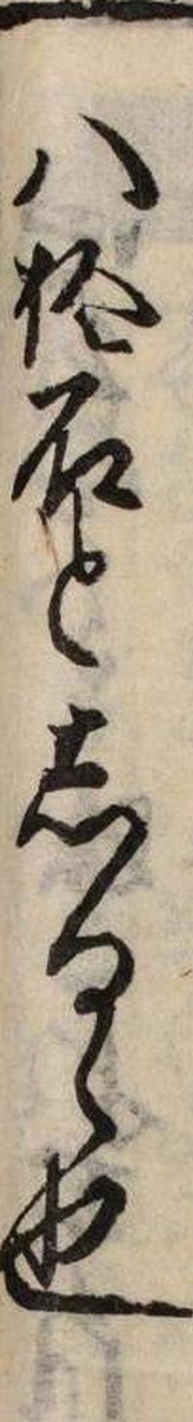八拾石としるゝ也
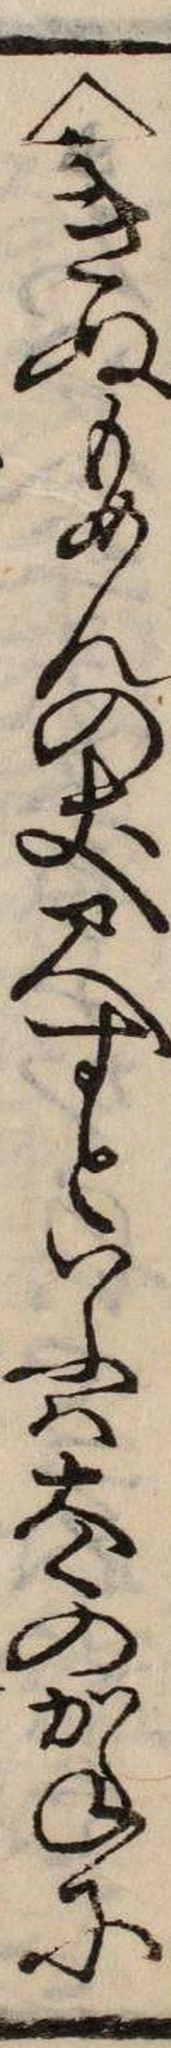△きぬもめんの丈尺寸といふは大くのかねに
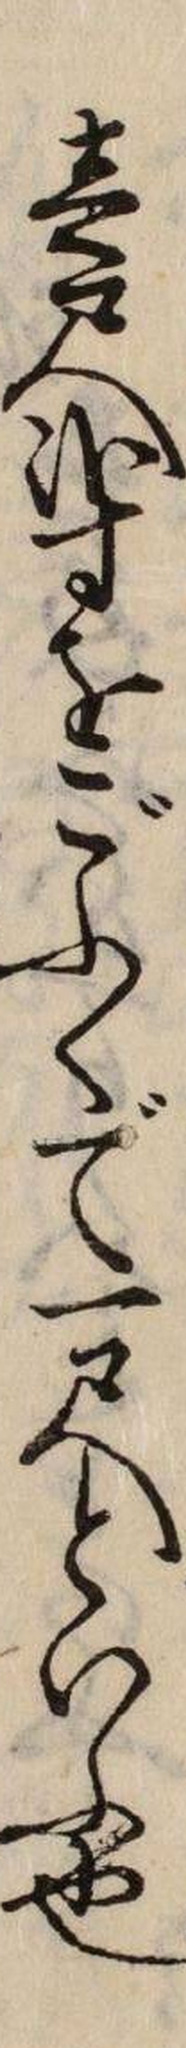一壱尺弐寸をごふくで一尺といふ也
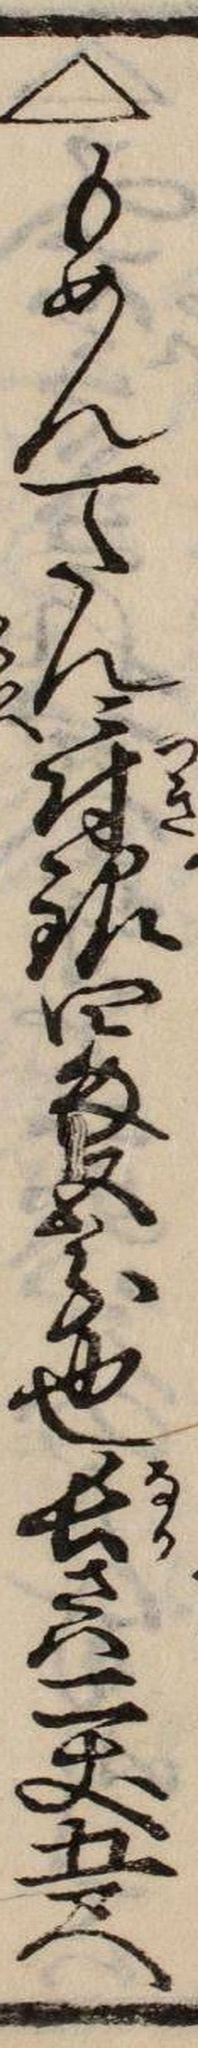△もめん一たんに付銀四匁五分也長さは二丈五尺
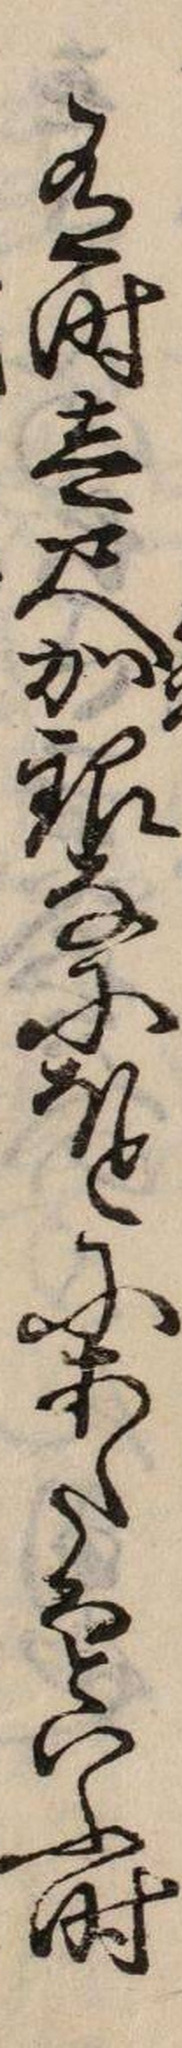有時壱尺加銀なにほとにあたるといふ時
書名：塵劫記（寛永11年自跋、京都府立京都学・歴彩館追貴8）
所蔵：京都府立京都学・歴彩館 国文学研究資料館
